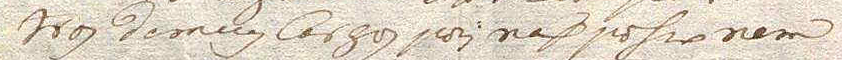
tros demais Cargos pois naõ posso nem
